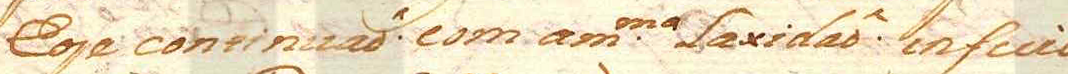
hoje continuaõ com a m.ma Laxidaõ infecio
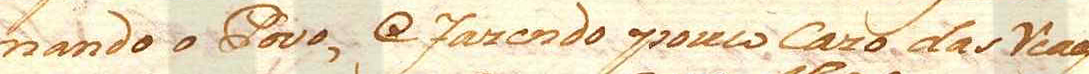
nando o Povo, e fazendo pouco cazo das reaes
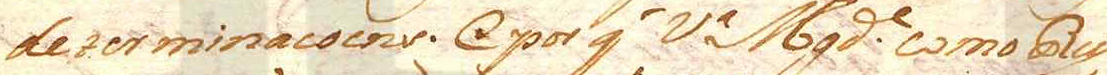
determinaçoens. e por q̄ V.a Mgd.e como Rey
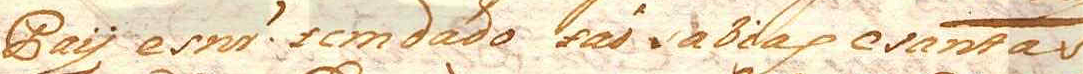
Pay e snr̄ tem dado taõ sabias e santas
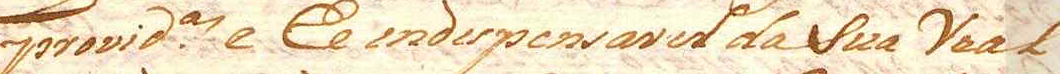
provid.as e he indespensavel da Sua real
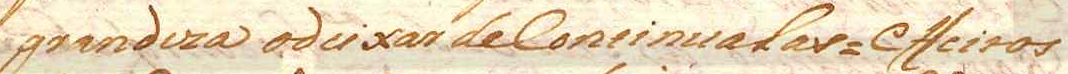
grandeza o deixar de ContinuaLas = effeitos
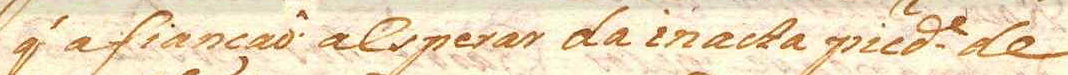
q̄ a fiançaõ a esperar da inacta pied.e de
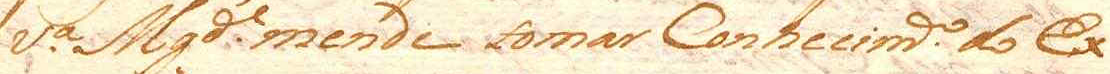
v.a Mgd.e mende tomar Conhecim.to do Ex
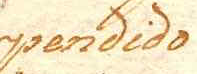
pendido
